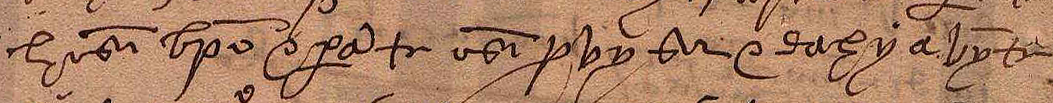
ho s̄or bpō e ꝑāte o s̄or ꝓvysor e dahy a vȳte
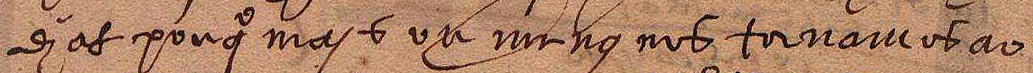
djas pouqo majs ou menꝯ nos tornamos ao
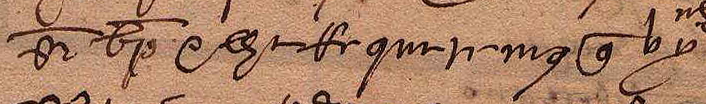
s̄r bpō e lhe Requeremꝯ q̄ vy
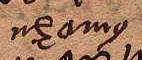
nhamꝯ
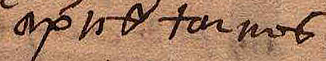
apres̄tarnos
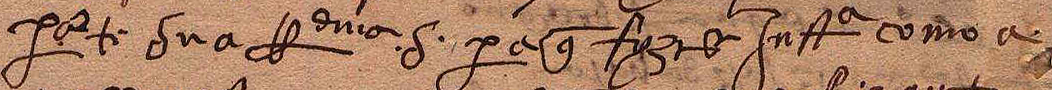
ꝑāte sua Rdma .S. ꝑa q̄ fyzese Justa como a
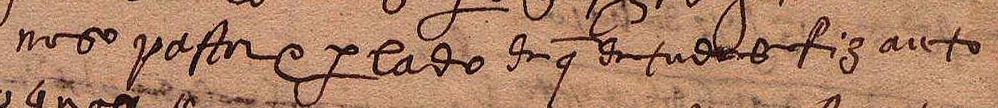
noso pastor e ꝑlado de q̅ de tudo se fiz auto
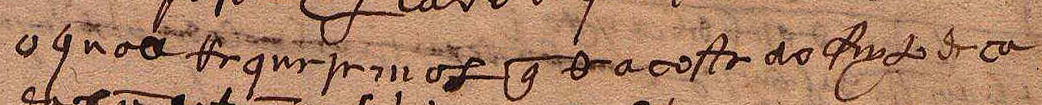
o quall Requeremos q̄ se acosta ao feyto de ca
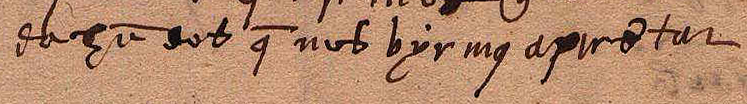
da hū dos q̄ nos vyemꝯ apre_tar
